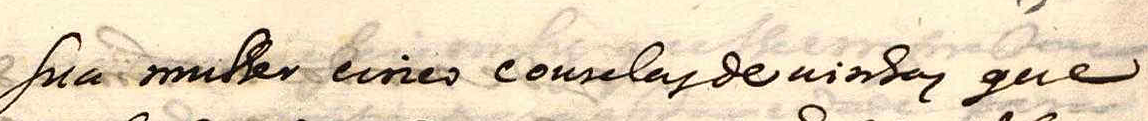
sua mulher cinco courelas de uinhas que
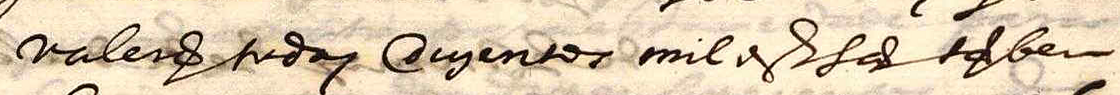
valerão todas duzentos mil rs E são tãobem
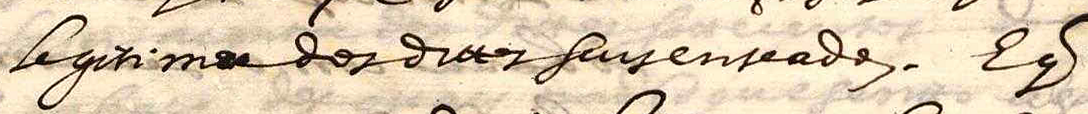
legitimas dos dittos seus enteados. E q̄
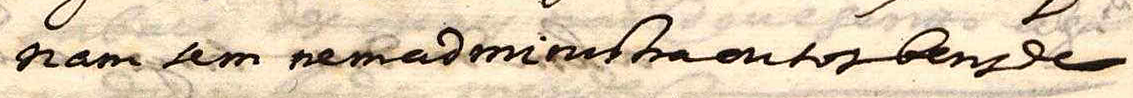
nam tem nem administra outtos bens de
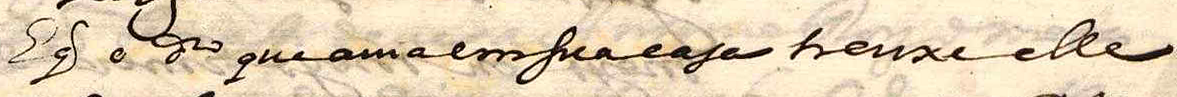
E q̄ o dro que auia em sua casa trouxe elle
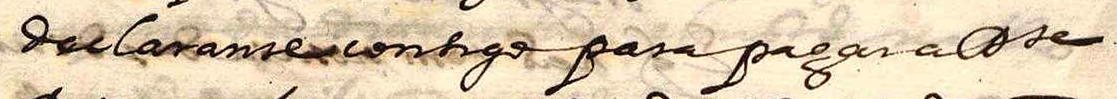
declarante consigo para pagar a Dte
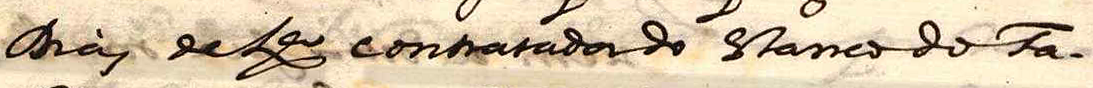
Dias de Lxa, contratador do estanco do Ta
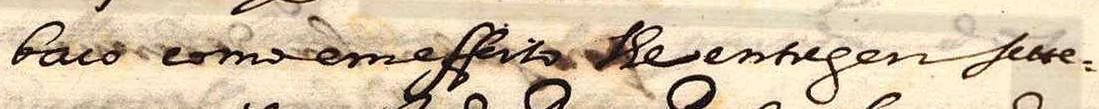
baco como em effeito lhe entregou sette
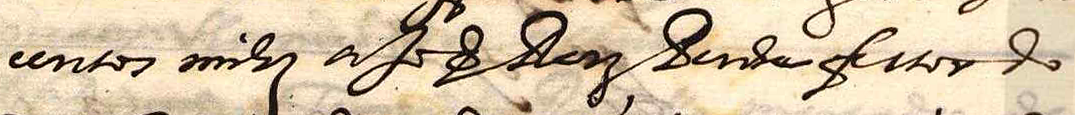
centos mil rs a João Roiz Penha feitor do
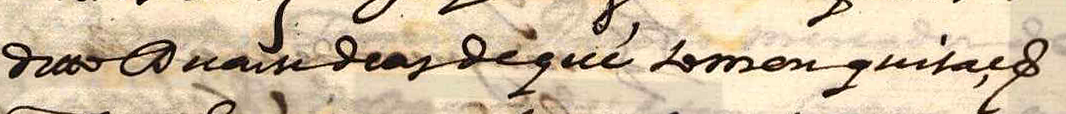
ditto Duarte dias de quē tomou quitação
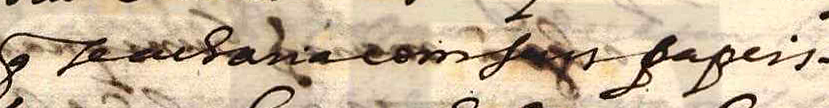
q̄ se acharia com seus papeis
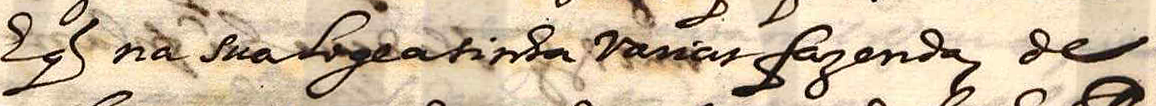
E q̄ na sua Logea tinha varias fazendas de
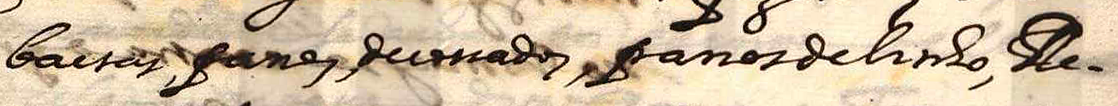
baetas, panos de cossados, panos de linho, Re
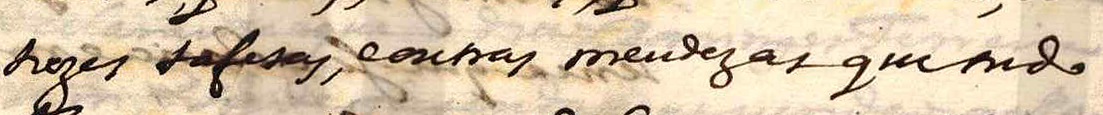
trozes tafetas, e outras meudezas que tudo
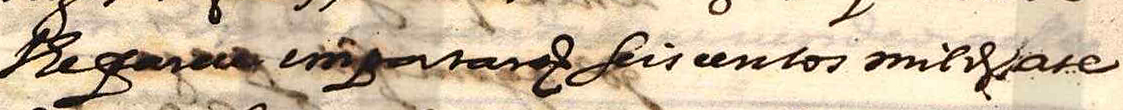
lhe parece importarão seiscentos mil rs ate
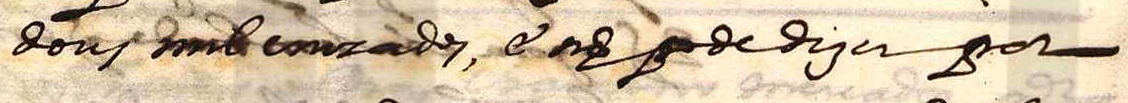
dous mil cruzados, e não pode dizer por
